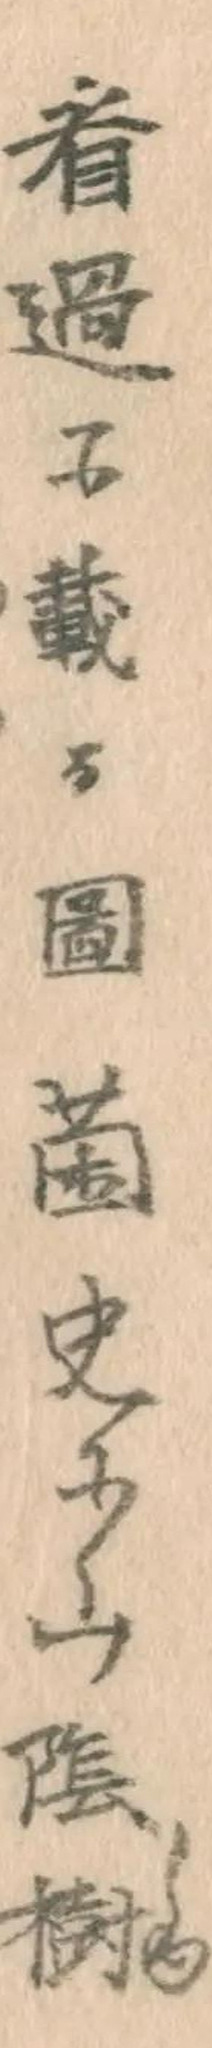看過に載る図菌史に山陰樹
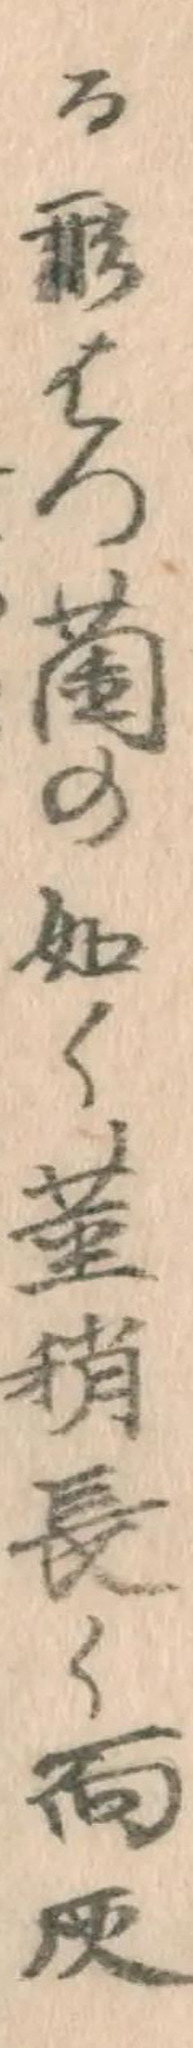る形はつ菌の如く茎稍長く面灰
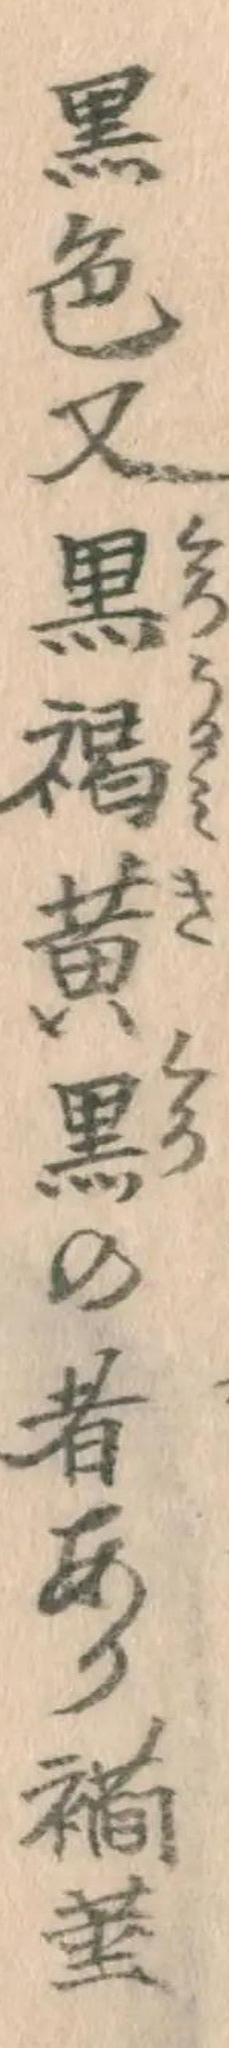黒色又黒褐黄黒の者あり茎
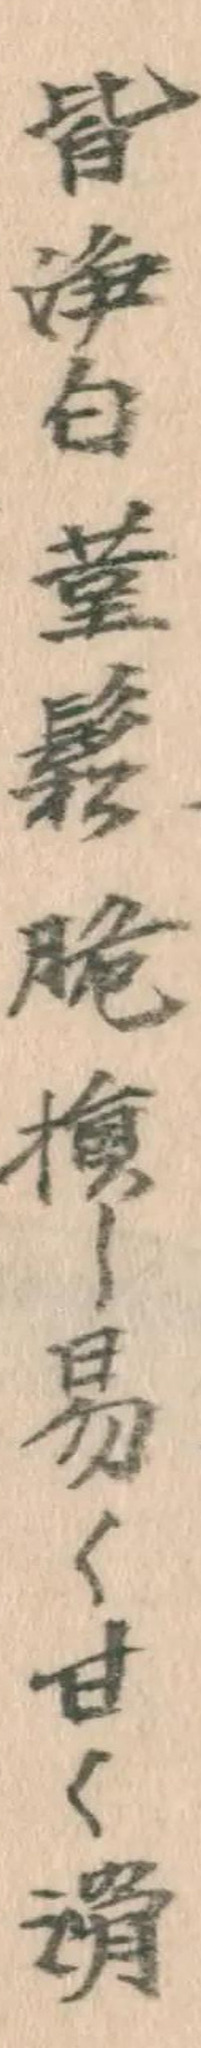皆浄白茎鬆脆し易く甘く滑
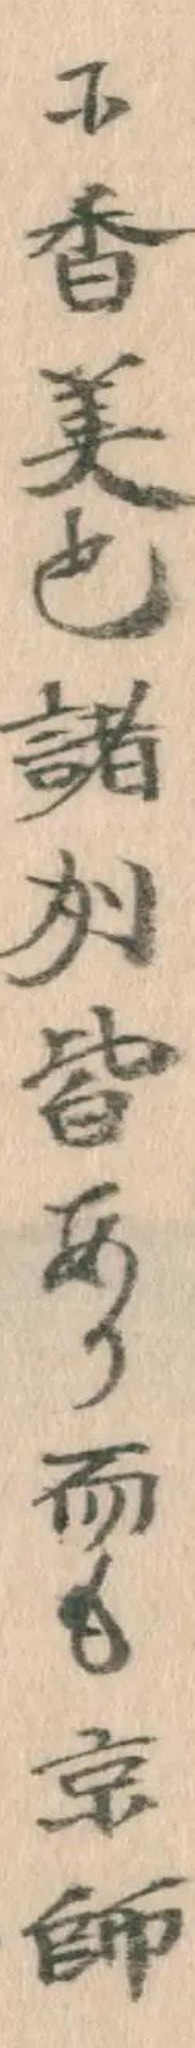に香美也諸州皆あり而も京師
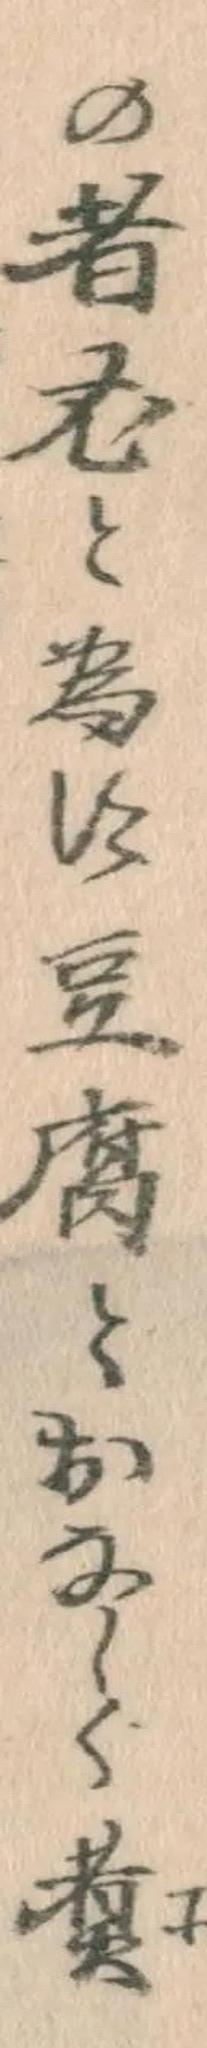の者尤と為す豆腐とおなしく煮
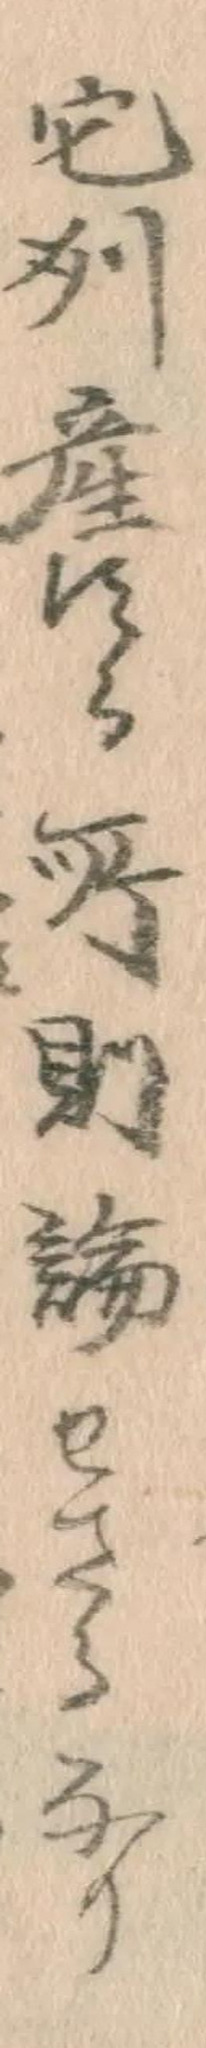它州産する所則論せさるなり
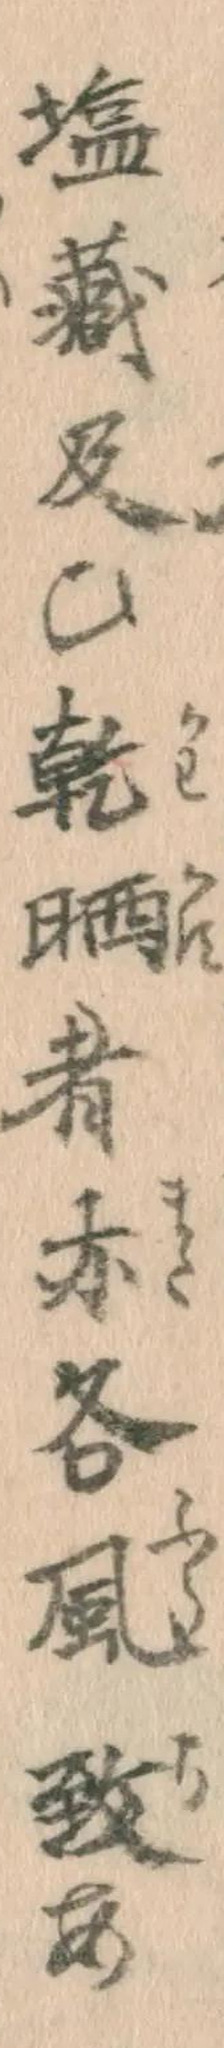塩蔵及ひ乾晒者亦各風致あ
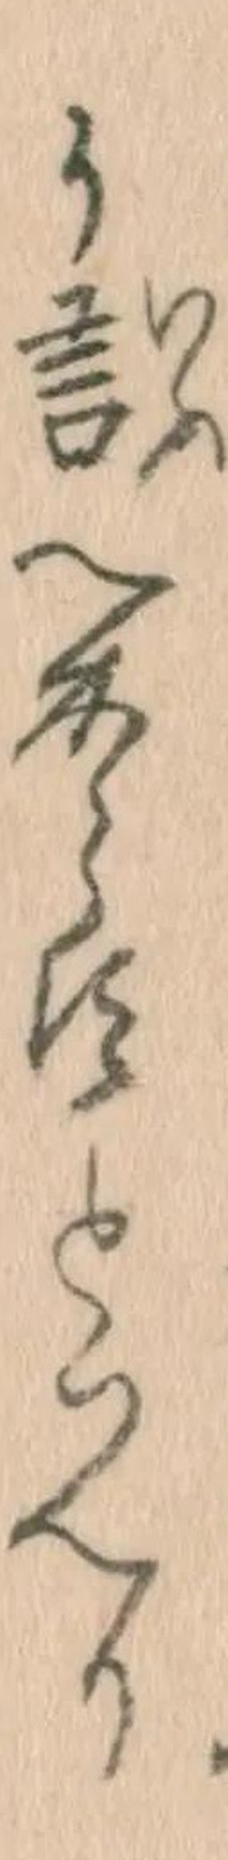り言へからすといへり
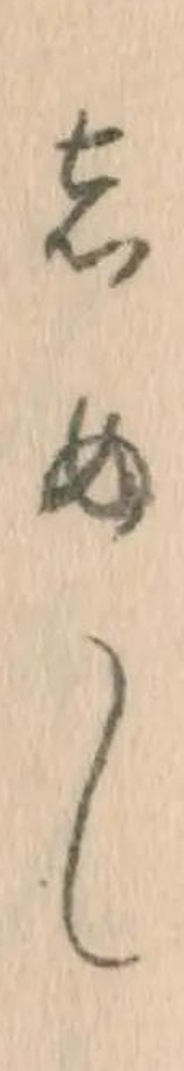しめし
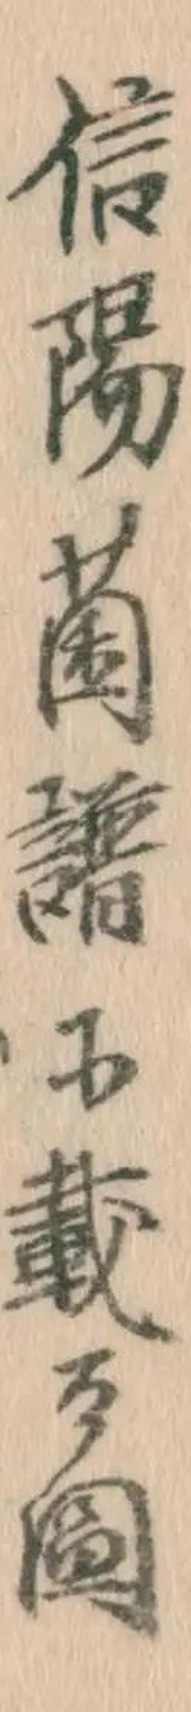信陽菌譜に載る図
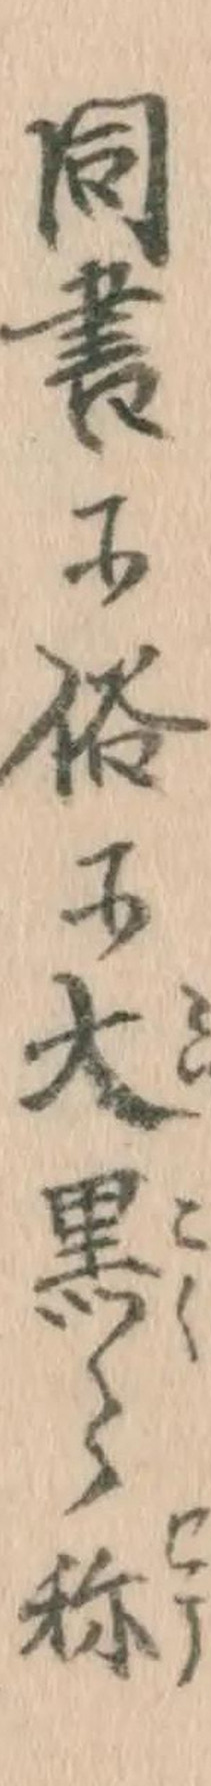同書に俗に大黒と称
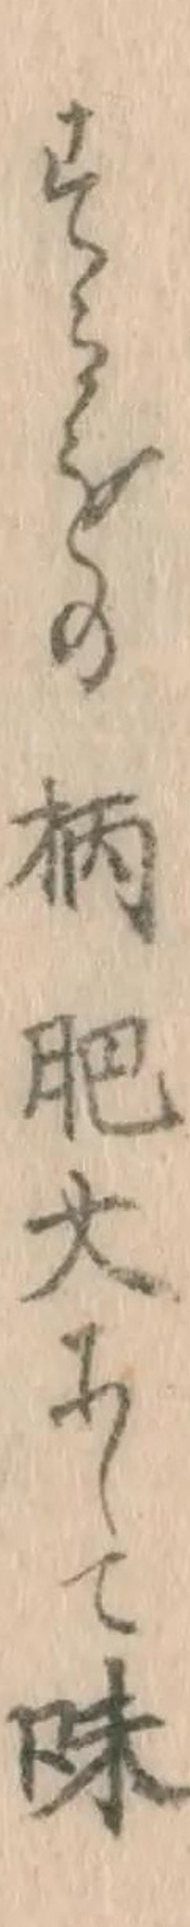するをの柄肥大にして味
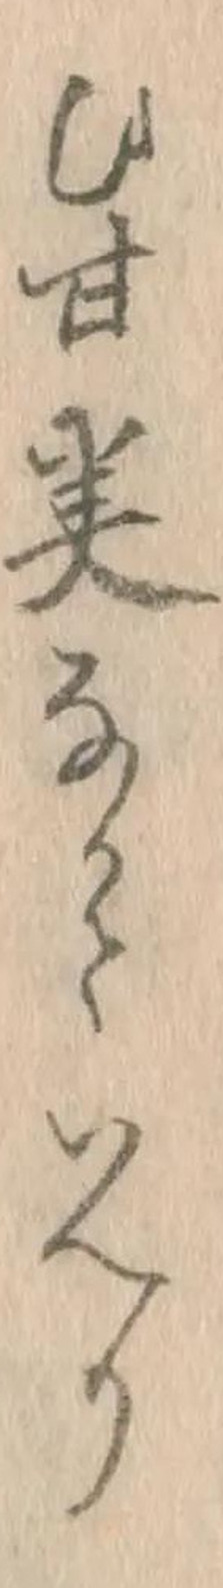ひ甘美なるといへり
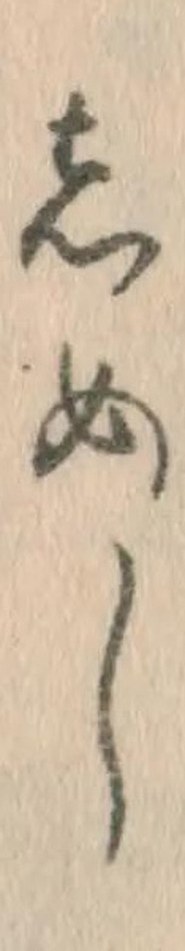しめし
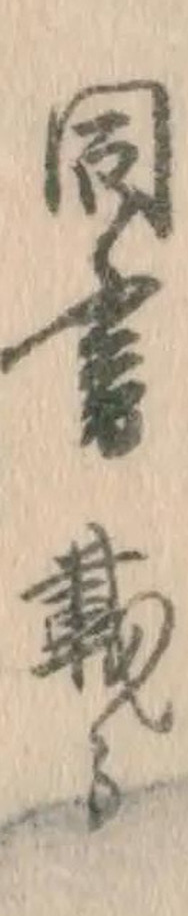同書載る
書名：本草図譜. 巻55-57
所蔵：国立国会図書館 National Diet Library, JAPAN
